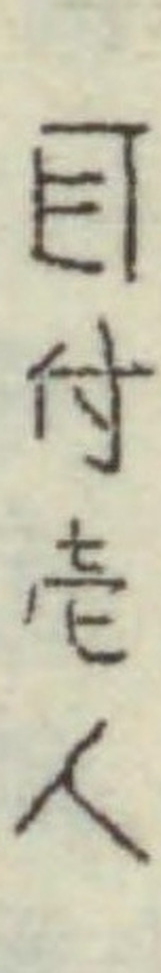目付壱人
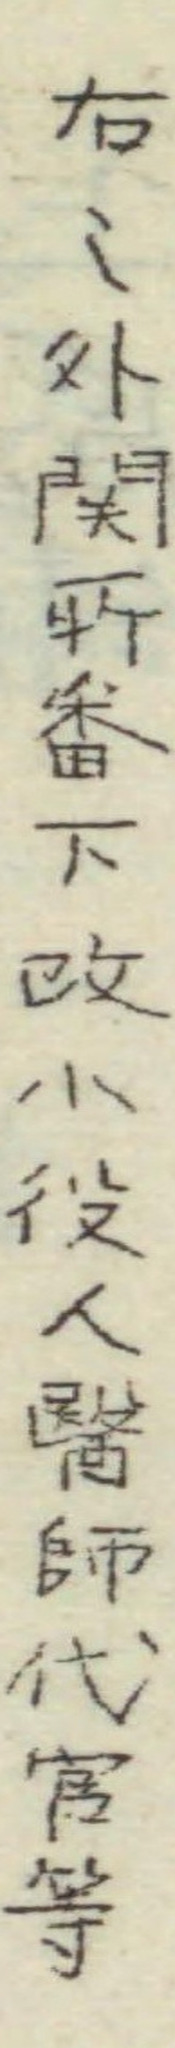右之外関所番下改小役人医師代官等

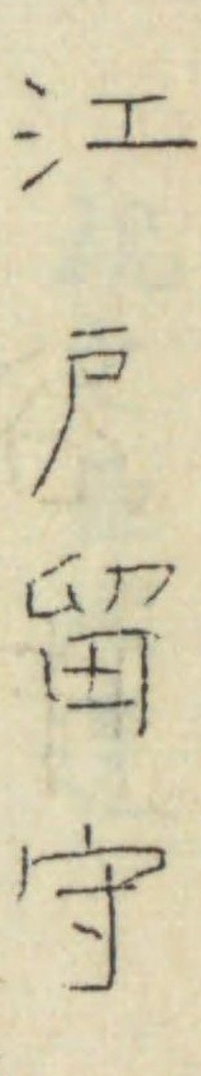江戸留守
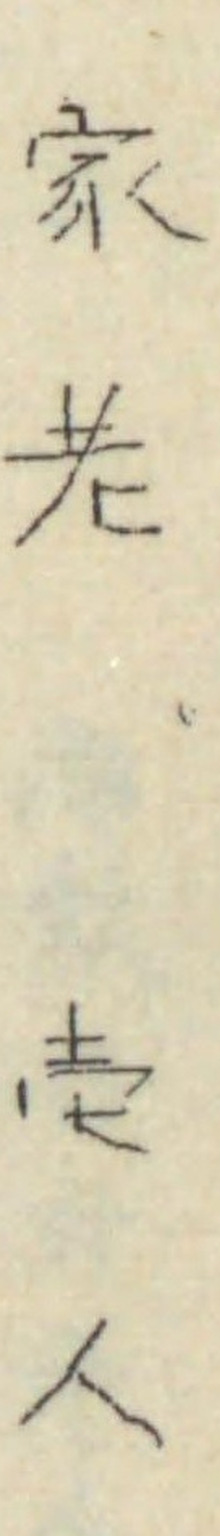家老壱人
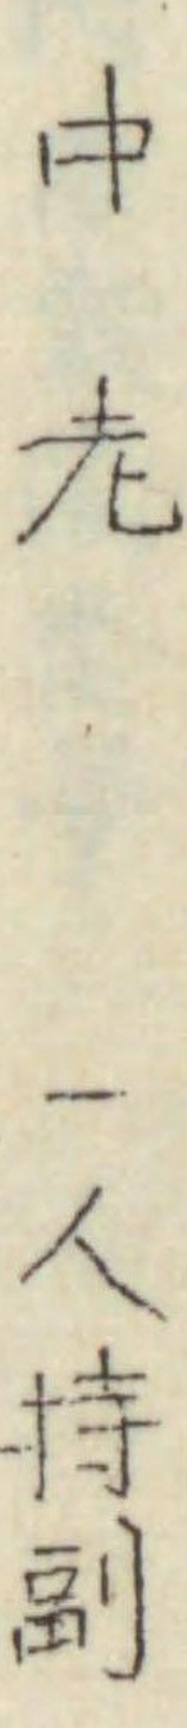中老一人持副
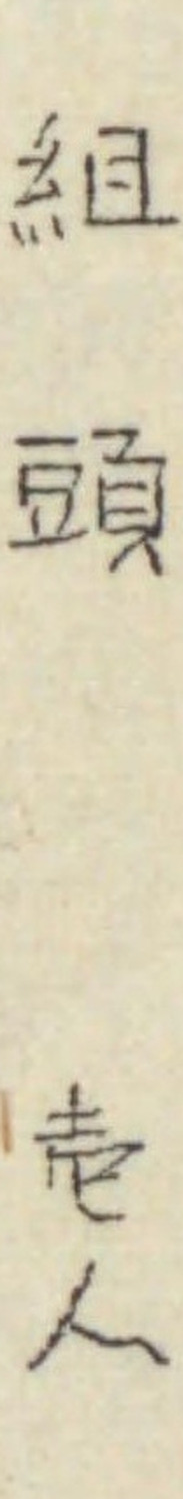組頭壱人
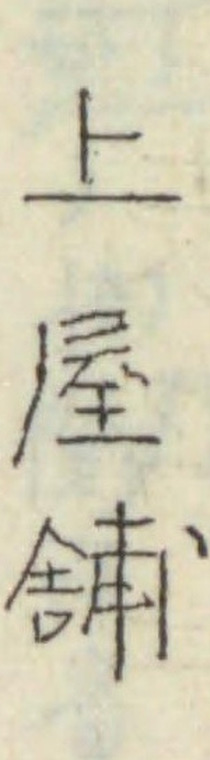上屋鋪
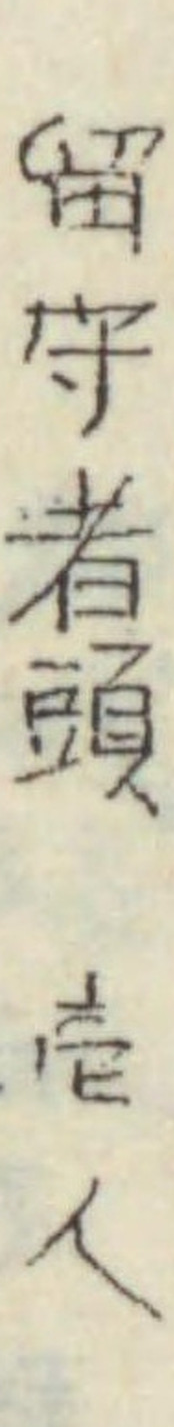留守者頭壱人
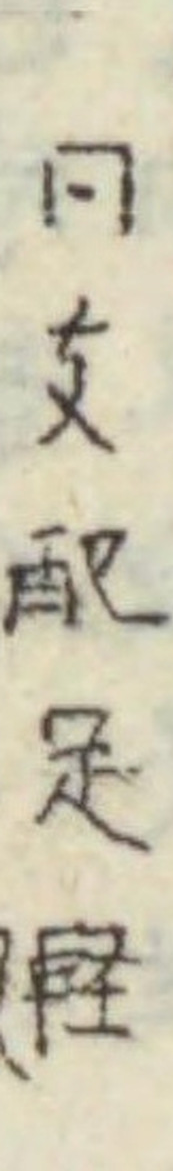同支配足軽
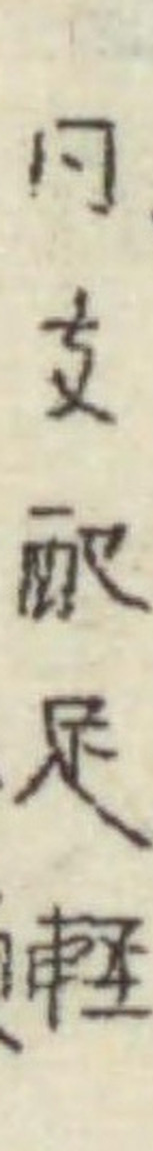同支配足軽
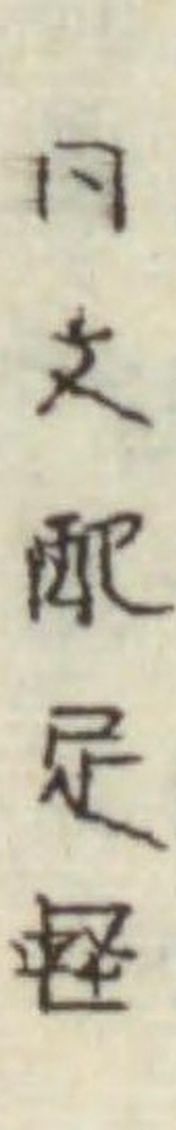同支配足軽
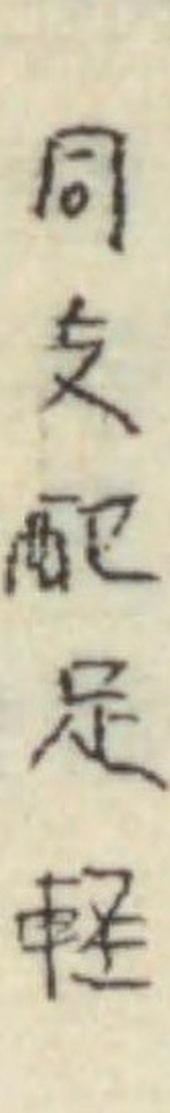同支配足軽
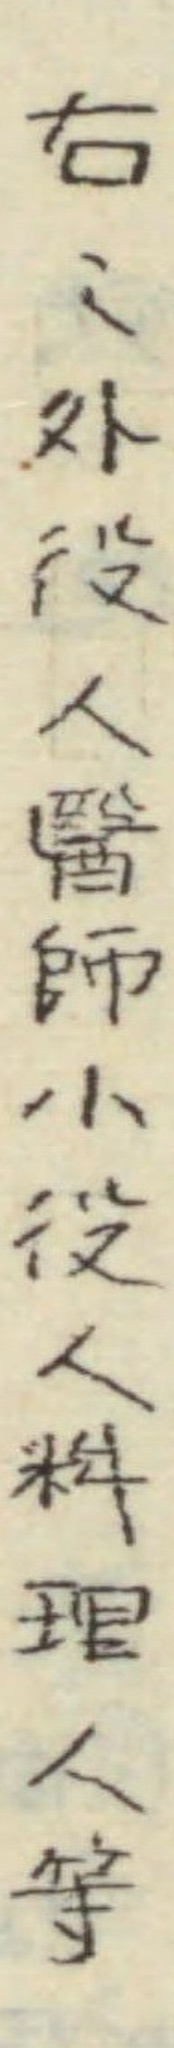右之外役人医師小役人料理人等
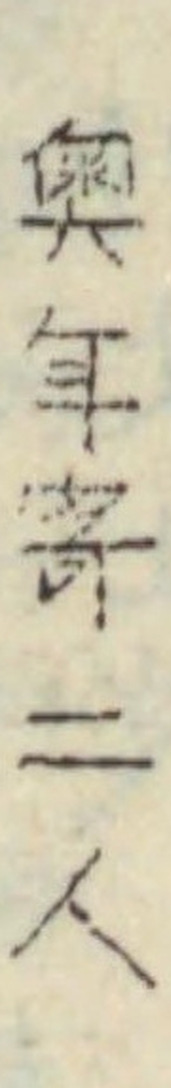奥年寄二人
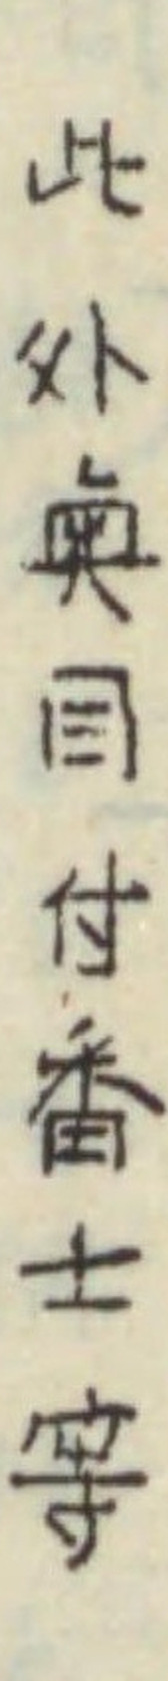此外奥目付番士等
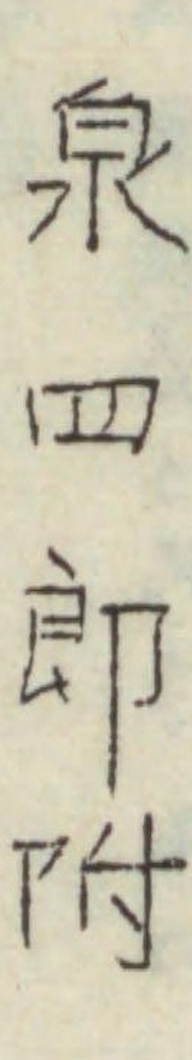泉四郎付
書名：三河吉田藩動員史料
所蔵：国立国会図書館 National Diet Library, JAPAN
